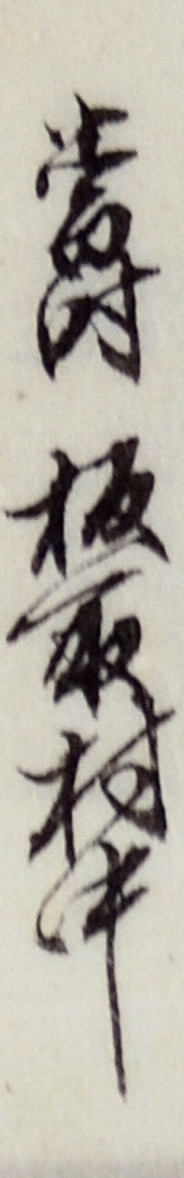当時板取村中
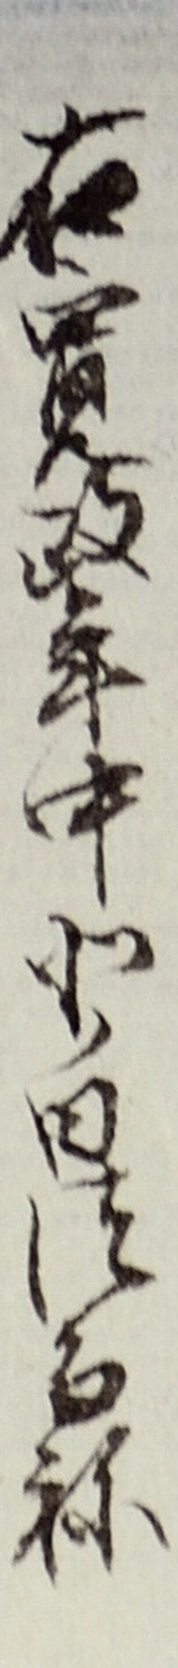右寛政年中北ノ日つるね
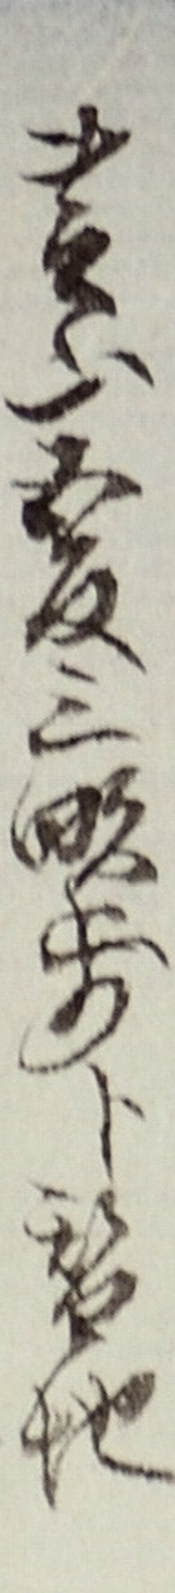芝山五反三畝歩ト替地
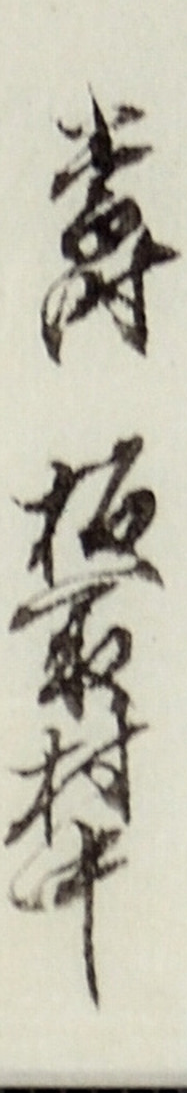当時板取村中
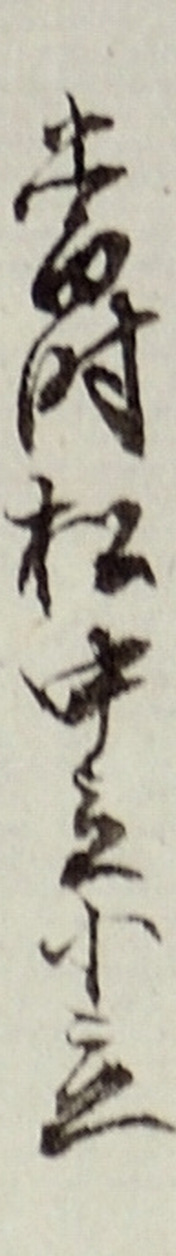当時松中立小立

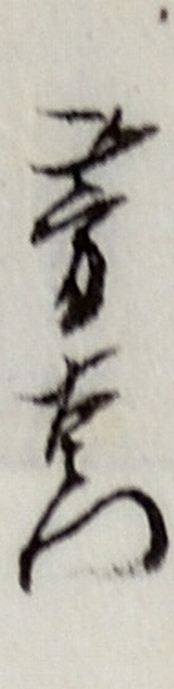芳右衛門
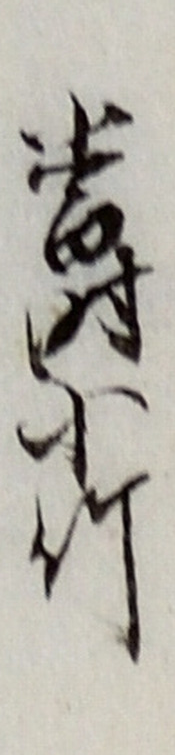当時小竹
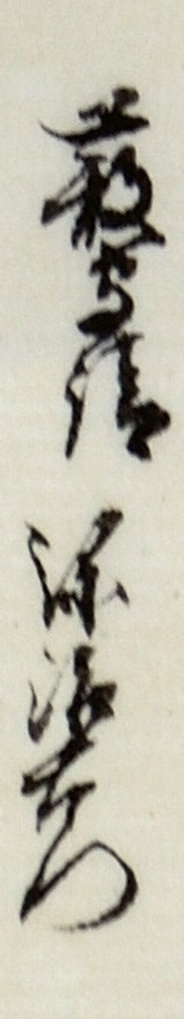藪守請喜右衛門
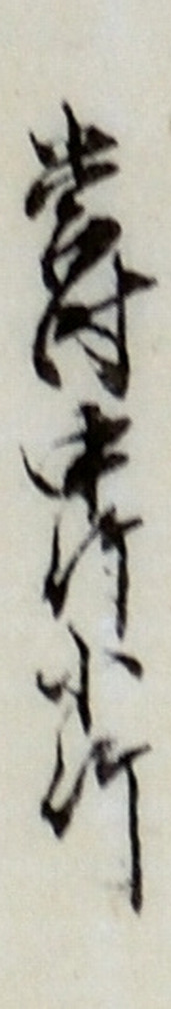当時中竹小竹

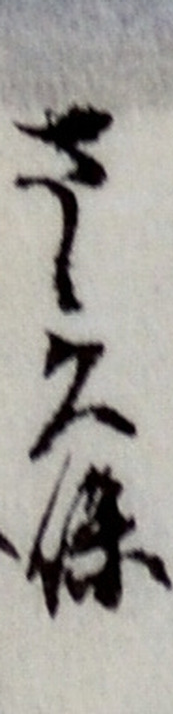さし久保
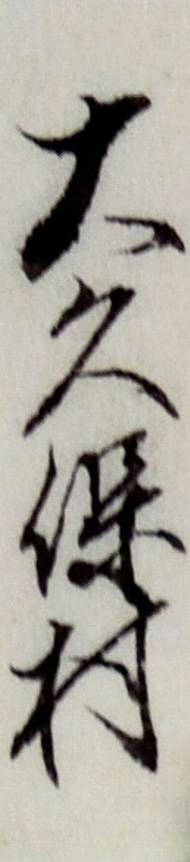大久保村
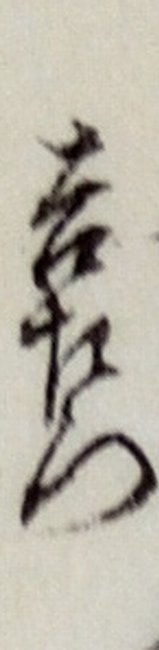吉左衛門
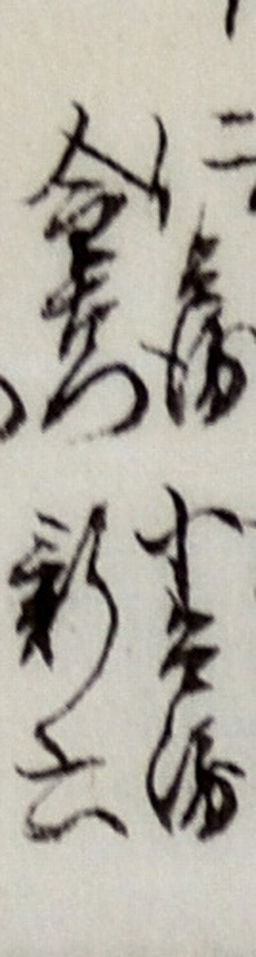金右衛門新六
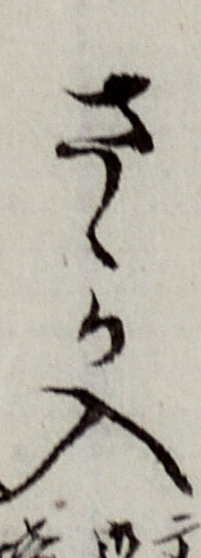さゝか入
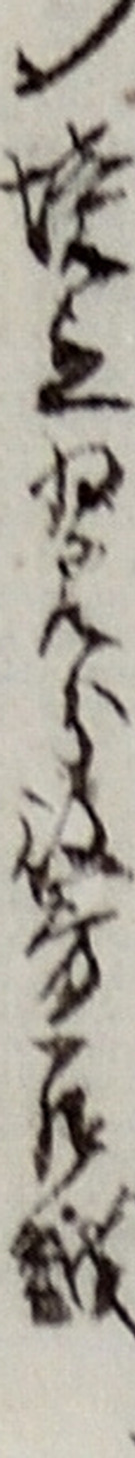境立為見分役方罷越
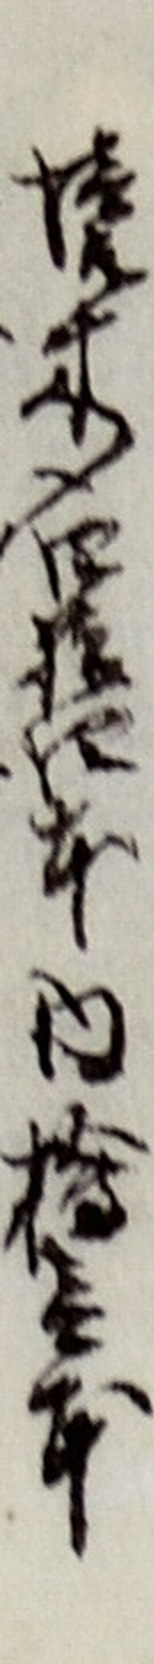境木〆四拾四本内拾壱本
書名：山林帳草稿
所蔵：伊那市立高遠町図書館・合同会社AMANE
